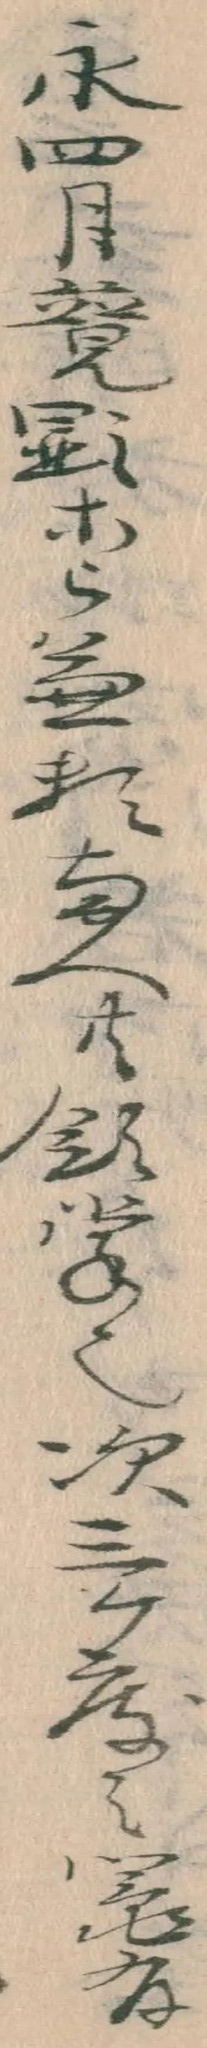永四月竟顕等被兼頼両人共領掌也次三ケ度之鬮有
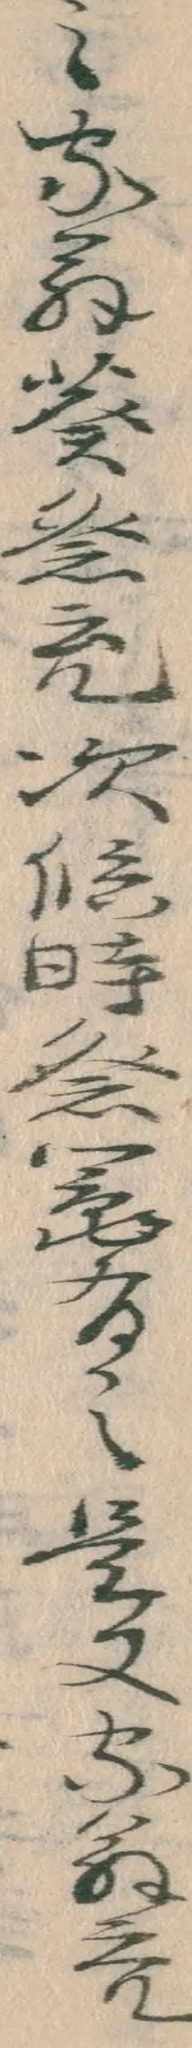之家翁葵祭次臨時祭鬮有之是又家翁充
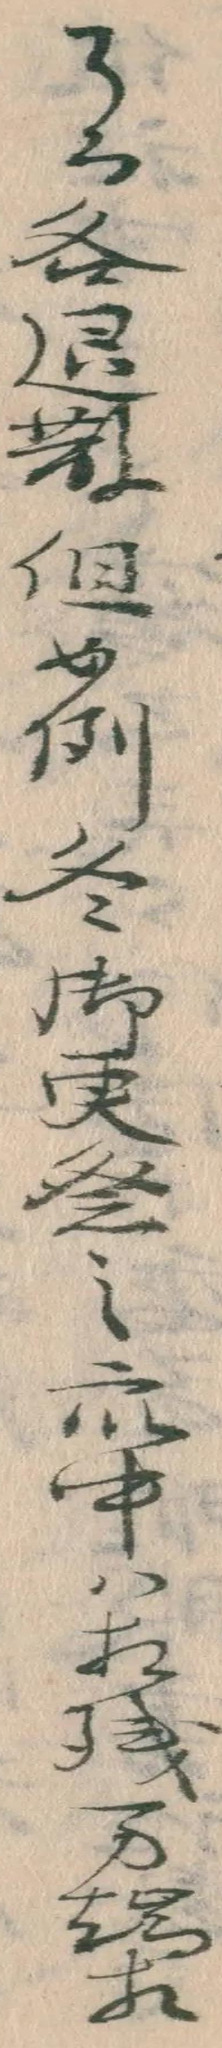了而各退散但如例冬御更祭之衆中ハ相残万端相
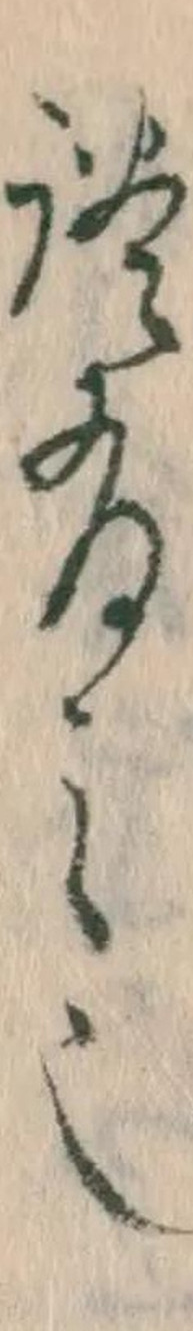談有之也
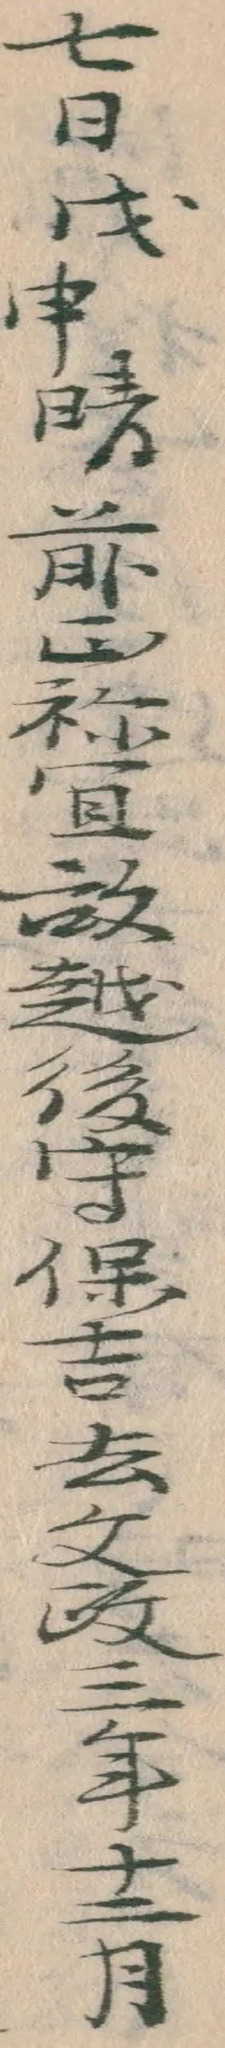七日戊申晴前正称宜故越後守保吉去文政三年十二月
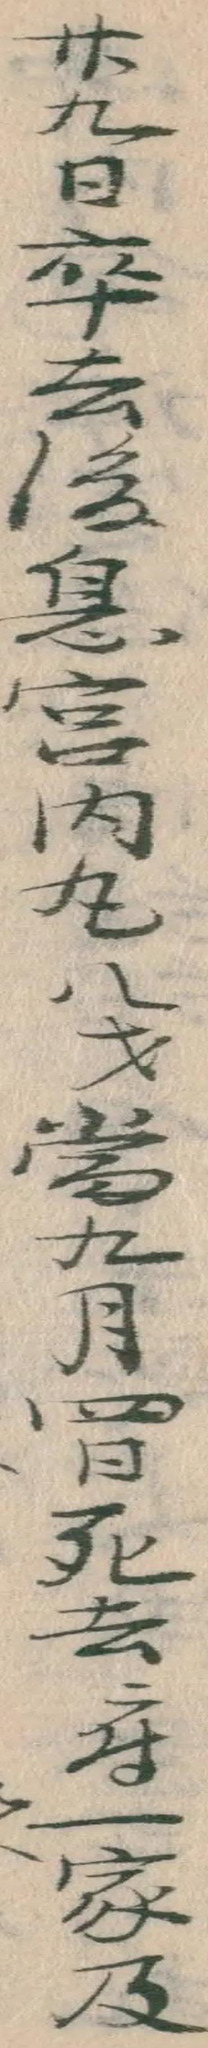廿九日卒去後息宮内丸八才當九月四日死去ニ付一家及
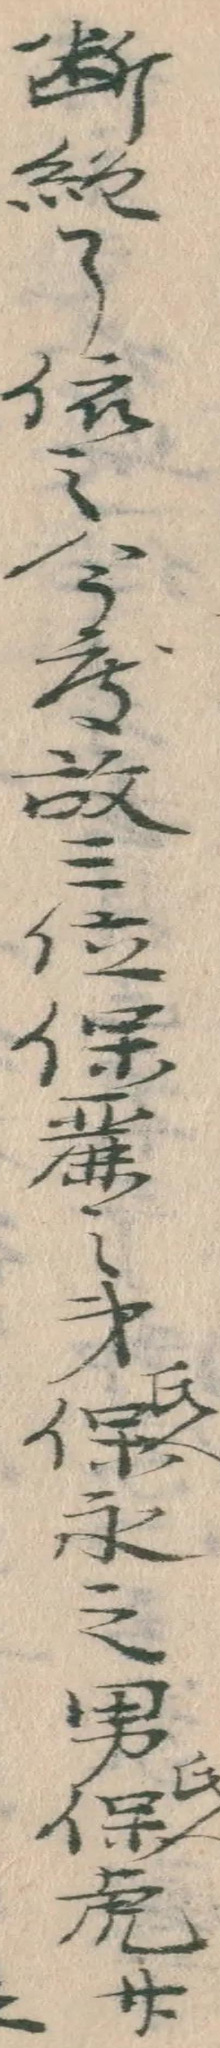断絶了依之今度故三位保麗之弟氏人保永之男氏人保虎廿
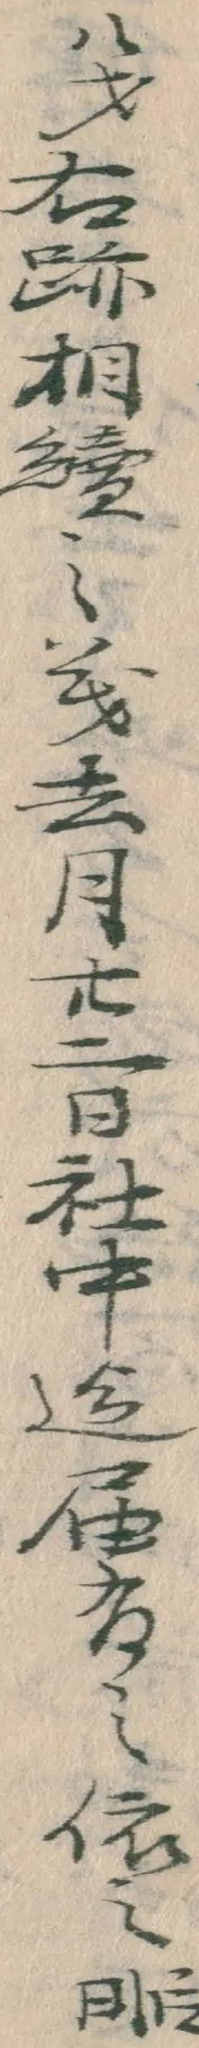八才右跡相續之義去月廿二日社中迄届有之依之暇
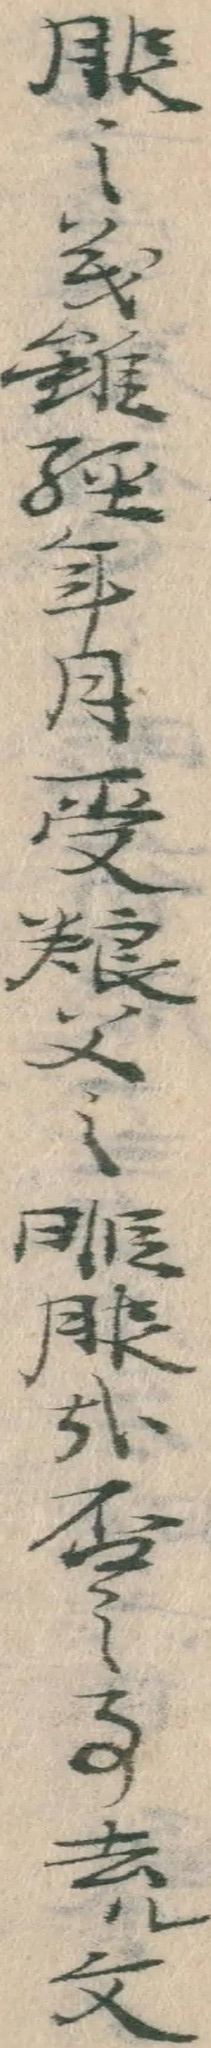服之義雖経年月受艱父之暇服哉否之事去ル文
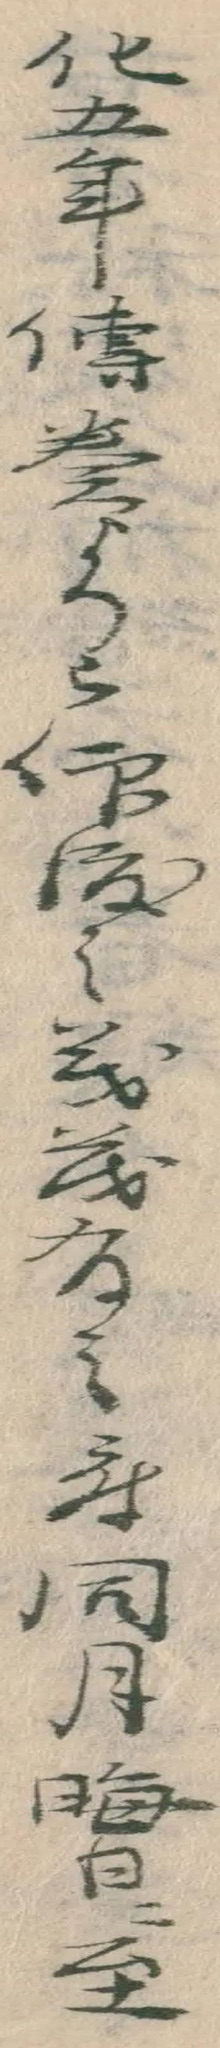化五年傳奏より被仰渡之義も有之ニ付同月晦日ニ至
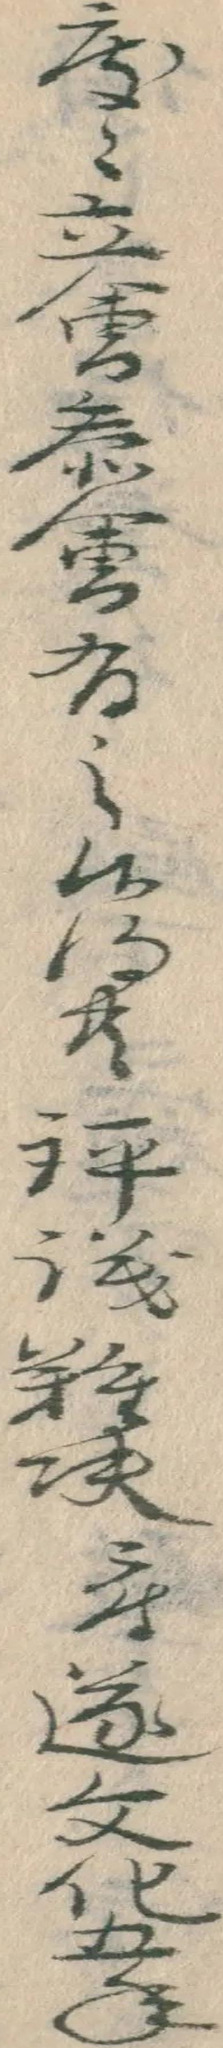度々立會参會有之候得共評議難決ニ付遂文化五年
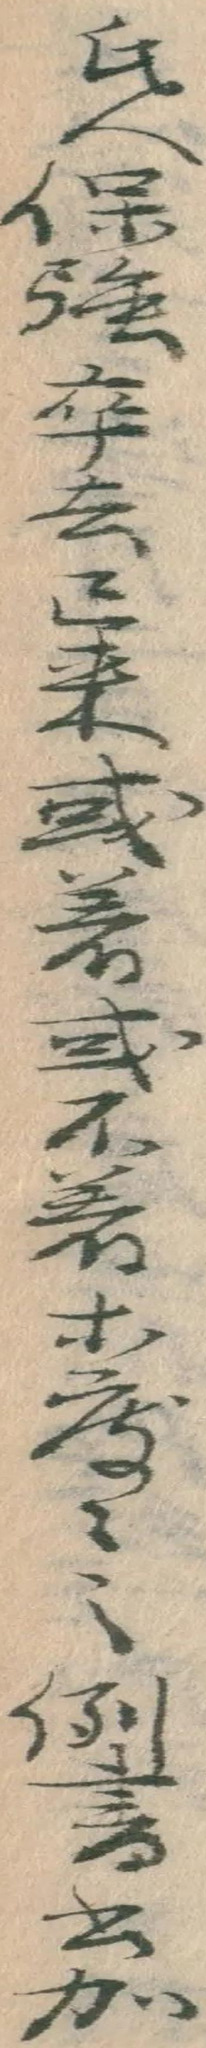氏人保強卒去已来或着或不着等度々之例書書加

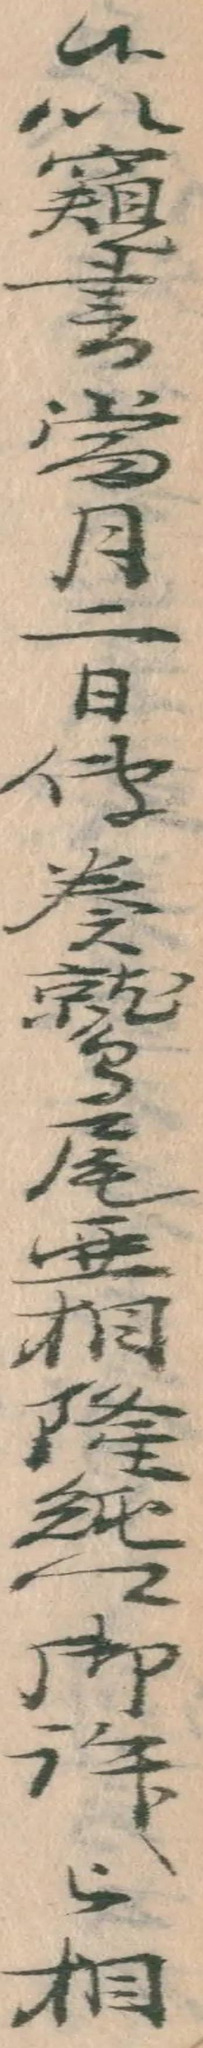候以窺書當月二日傳奏鷲尾亜相隆純卿御許へ被相
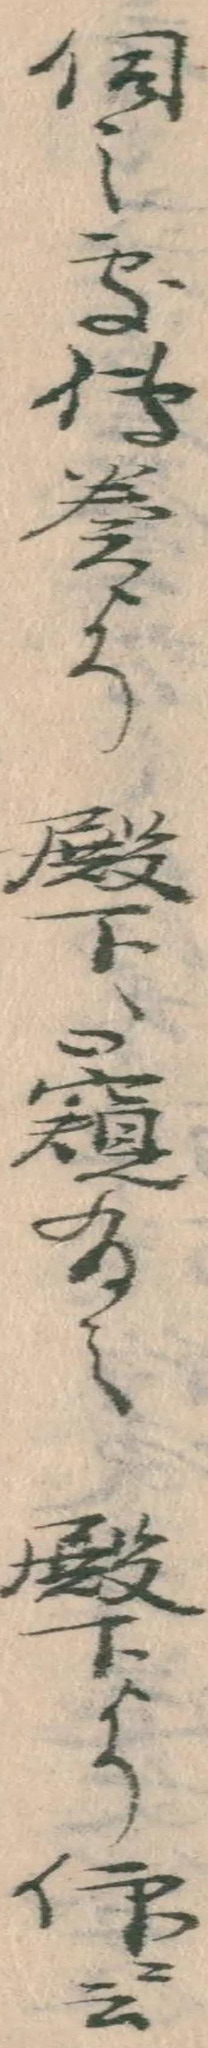伺之處傳奏より殿下へ御窺有之殿下より仰ニ云
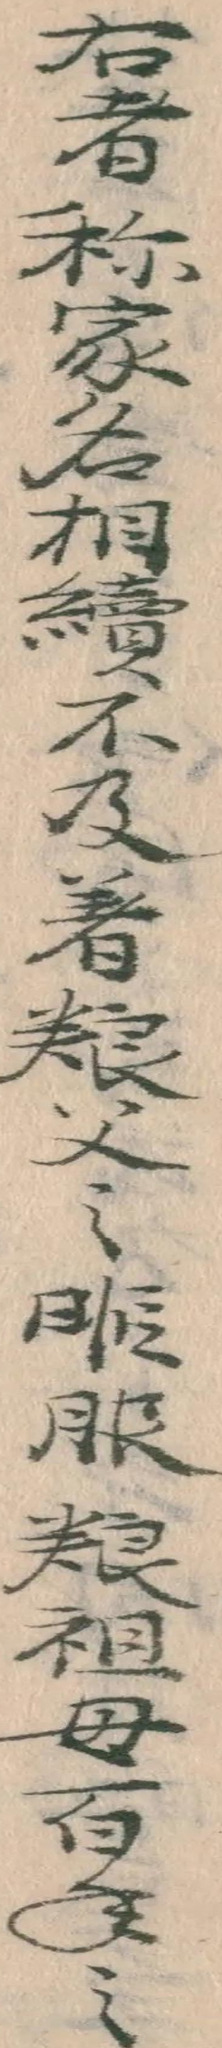右者称家名相續不及着艱父之暇服艱祖母百年之
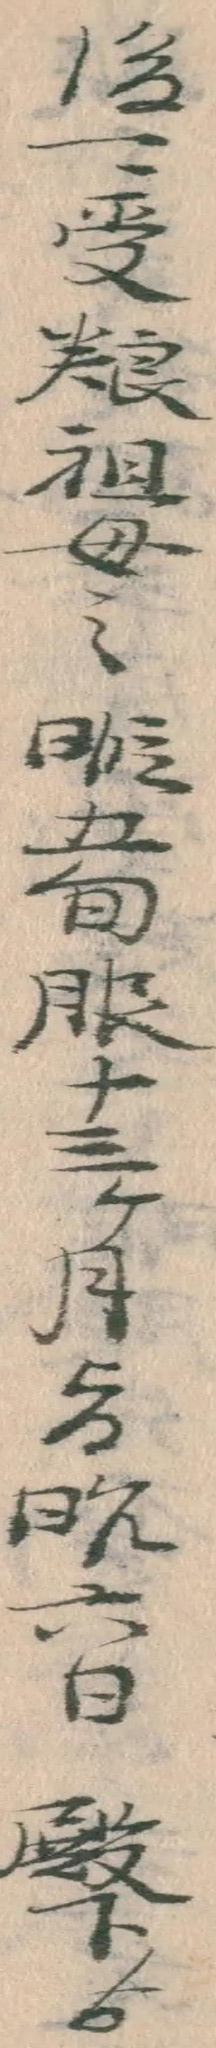後可受艱祖母之暇五旬服十三ケ月旨昨六日殿下ゟ
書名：賀茂社記録. 第63冊
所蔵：国立国会図書館 National Diet Library, JAPAN
